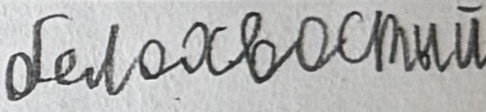белохвостый
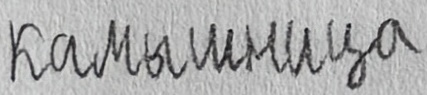камышница
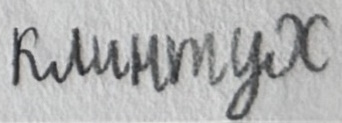клинтух
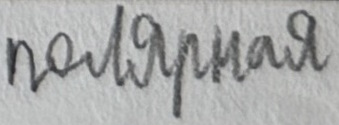полярная
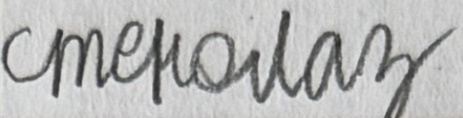стенолаз
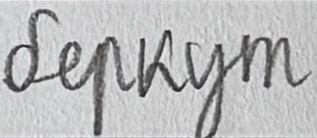беркут
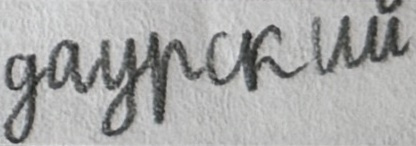даурский
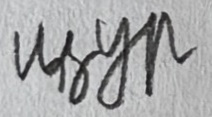щур
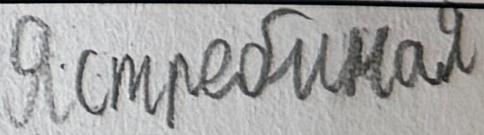ястребиная
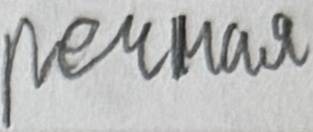речная
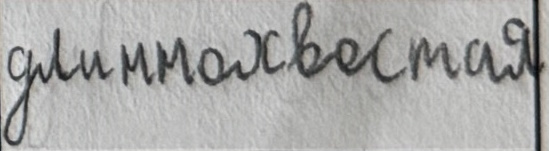длиннохвестая
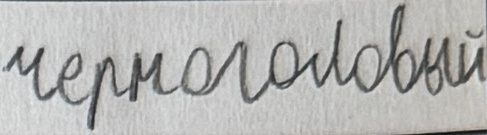черноголовый
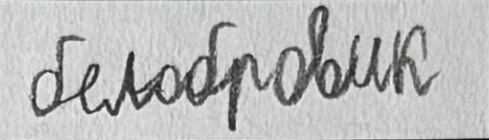белобровик
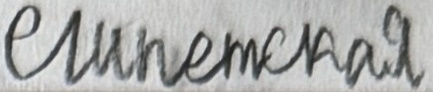египетская
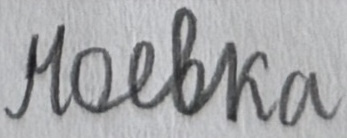моевка
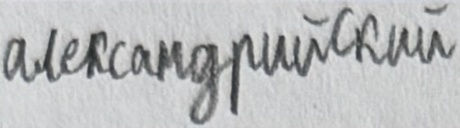александрийский
